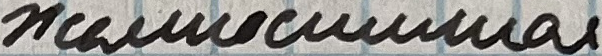желтоспинная
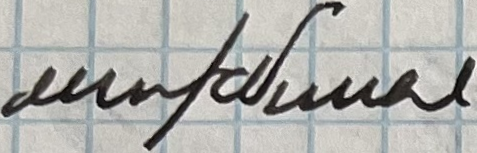ястребиная
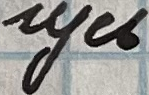гусь
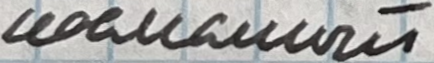косматый
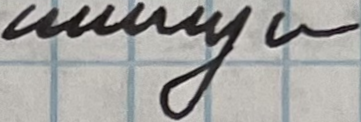шипун
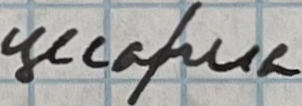цесарка
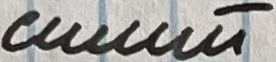синий
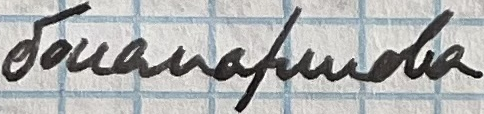бонапартова
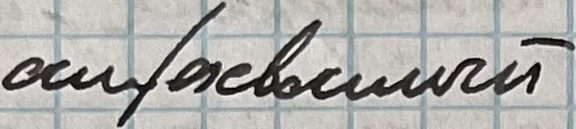острохвостый
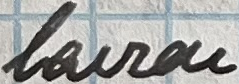волчок
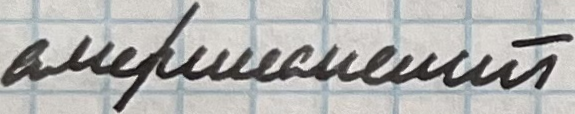америиансиий
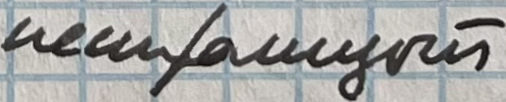пестролицый
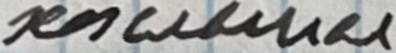хохлатая
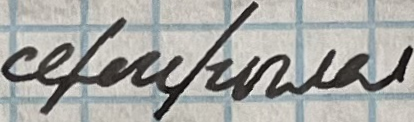серокрылая
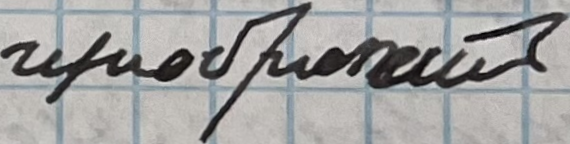чернобрюхий
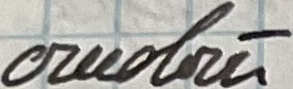очковый
